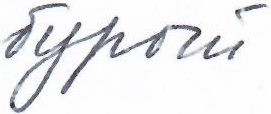бурый
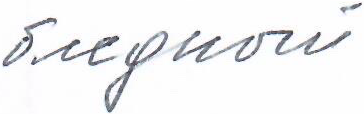бледный
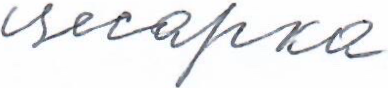цесарка
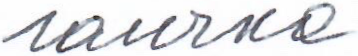гаичка
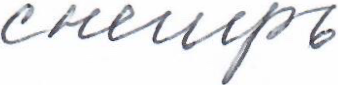снегирь
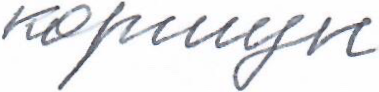коршун
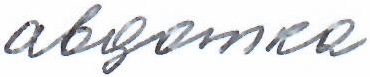авдотка
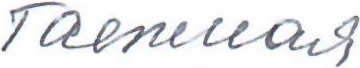таежная
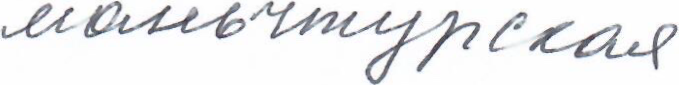маньчжурская
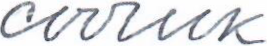сычик
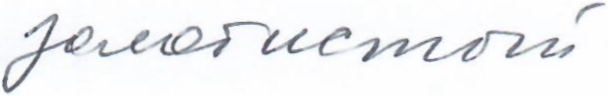золотистый
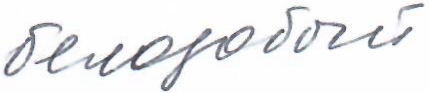белозобый
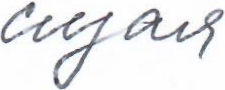сизая
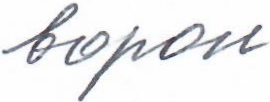ворон
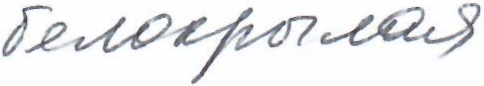белокрылая
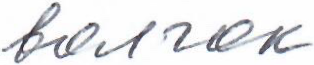волчок
